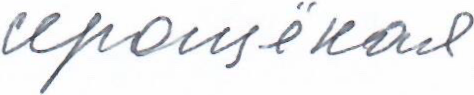серощёкая
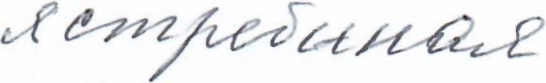ястребиная
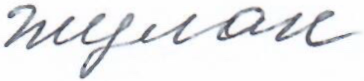жулан
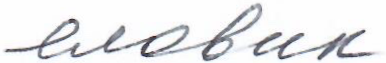еловик
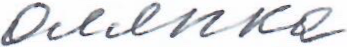оляпка
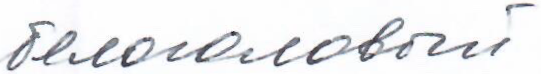белоголовый
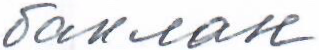баклан
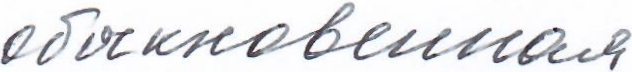обыкновенная
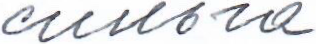синьга
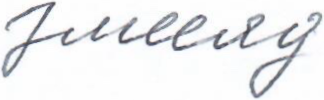змееяд
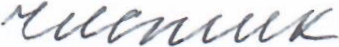чистик
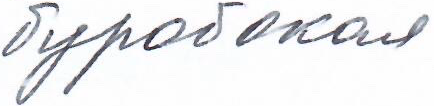буробокая
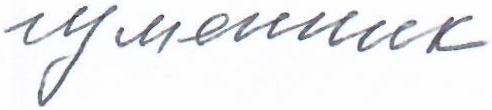гуменник
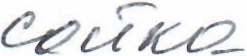сойка
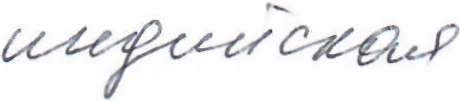индийская
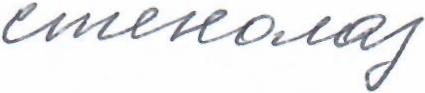стенолаз
